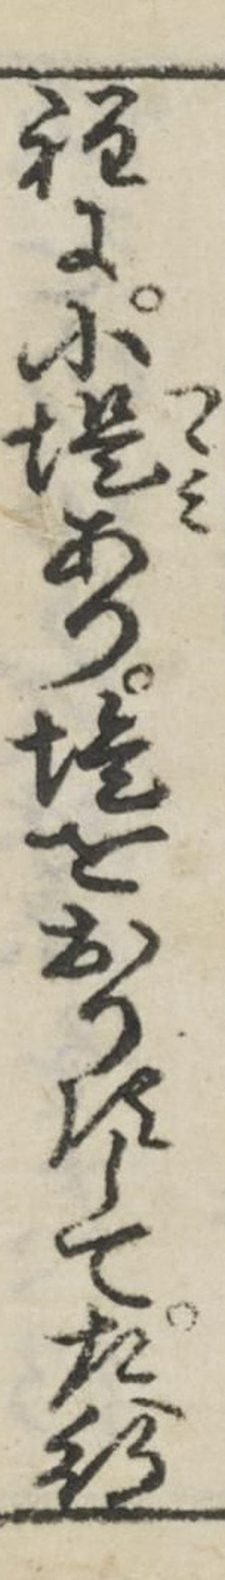程に。小堤あり。境をおりすして。左へ行
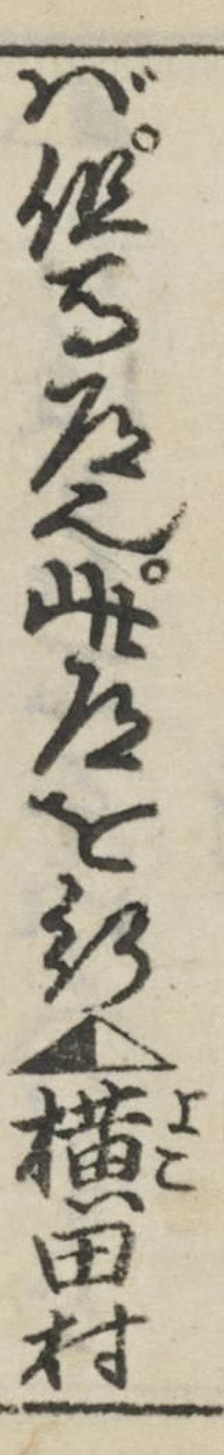ば。但馬道也。此道を行▲横田村
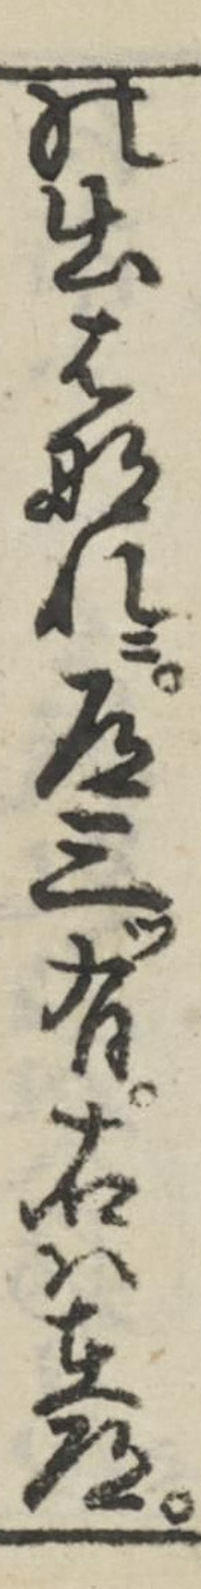の出はなれに。道三つ有。右は在道。
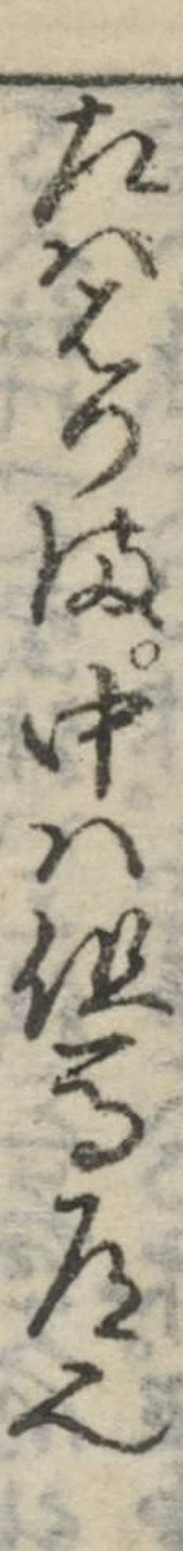左ははりま。中は但馬道也
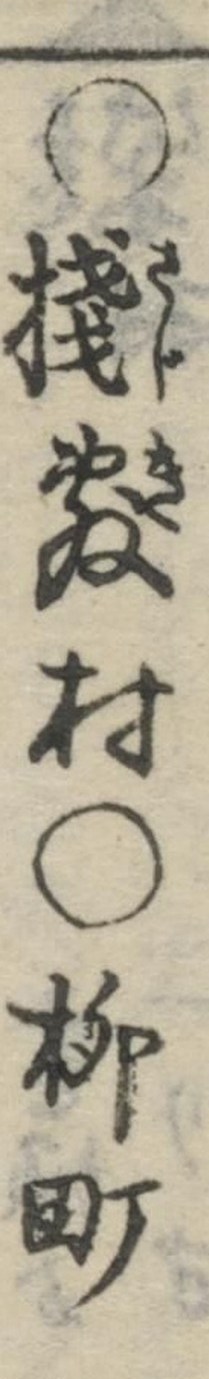○桟敷村○柳町
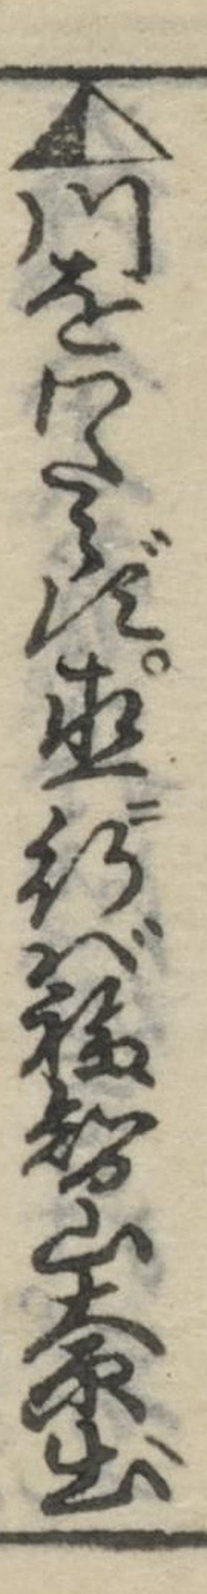▲川をわたらず。直に行ば福智山大原へ出
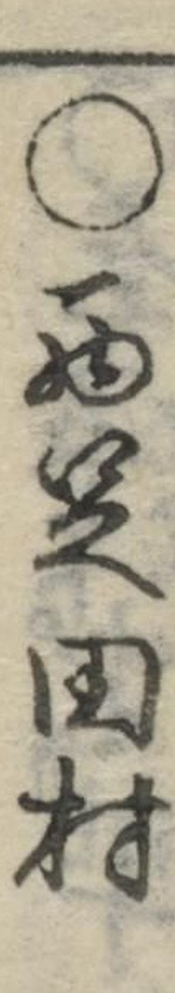○西足田村
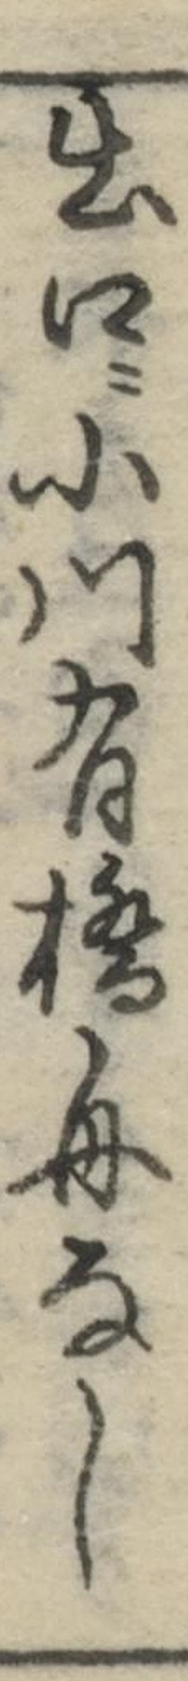出口に小川有橋舟なし
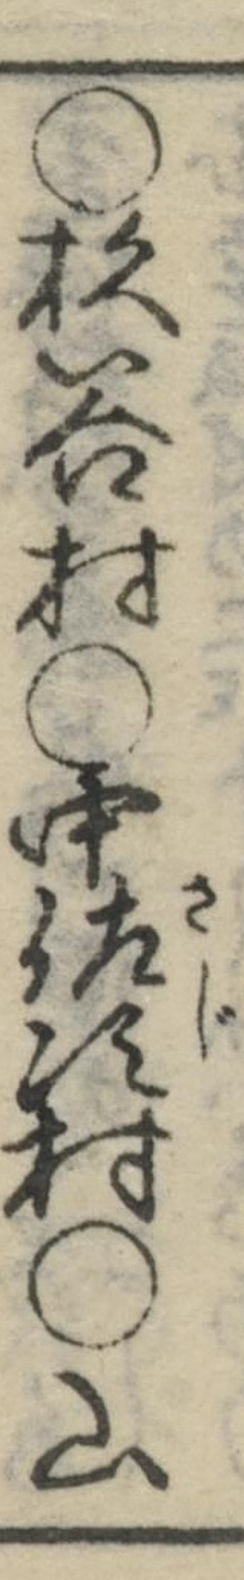○杉谷村○中佐次村○山
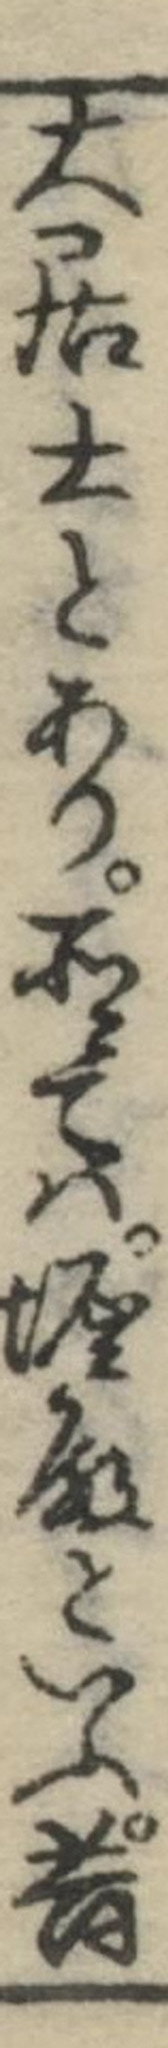大居士とあり。所にては。堀殿といふ。昔
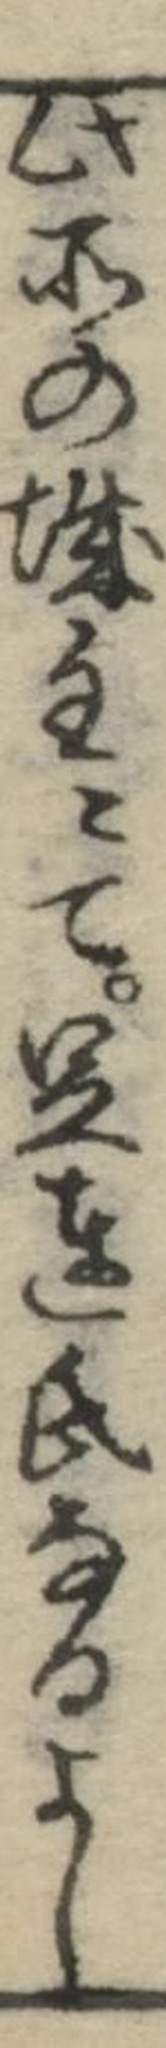此所の城主にて。足達氏なるよし

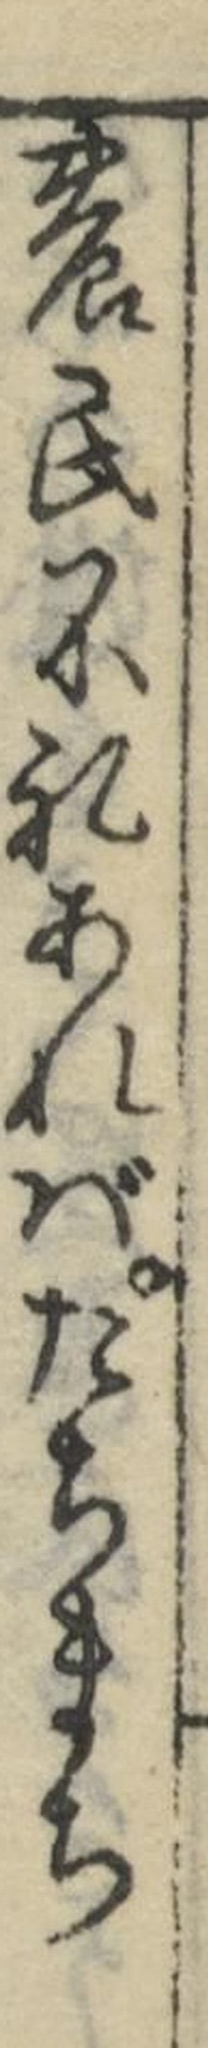農民不礼あれば。たちまち
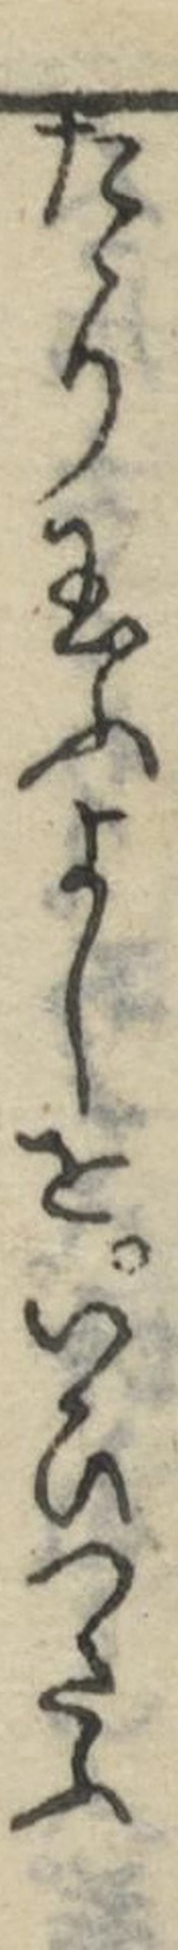たゝり玉ふよしを。いひつたふ
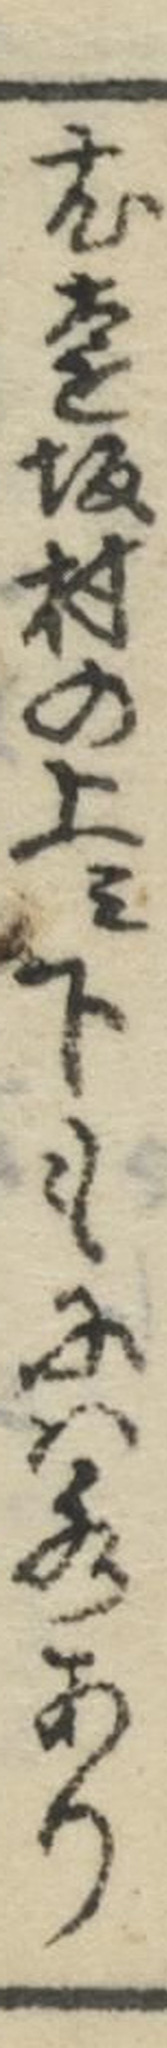尤遠坂村の上み下もには水あり
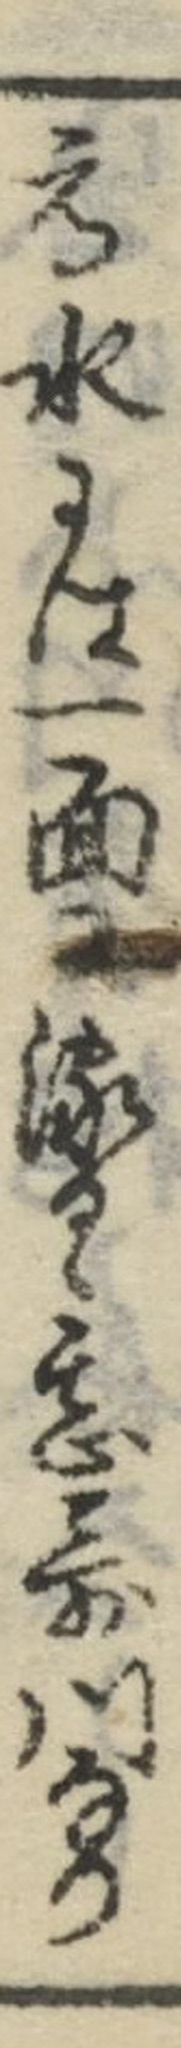高水には一面に流るゝ甚早川なり
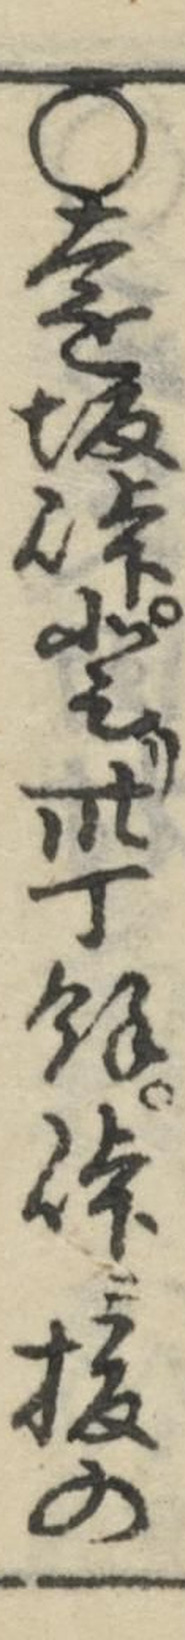○遠坂峠。登り丗丁余。峠に榎の
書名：但州城崎浴湯辧
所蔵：東京大学地震研究所図書室 Earthquake Research Institute Library, The University of Tokyo, JAPAN
